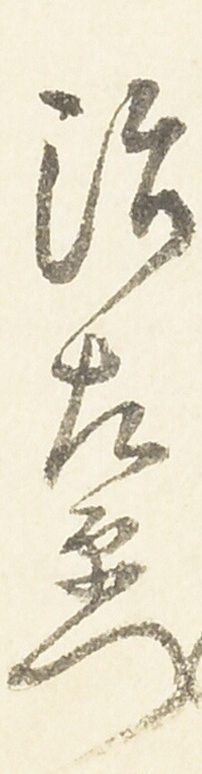治左衛門
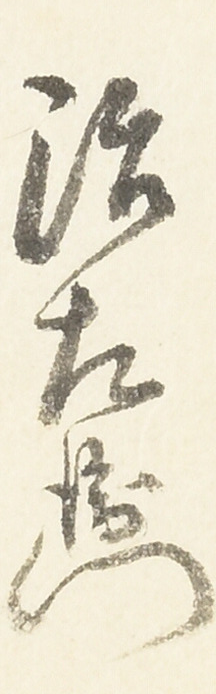治左衛門
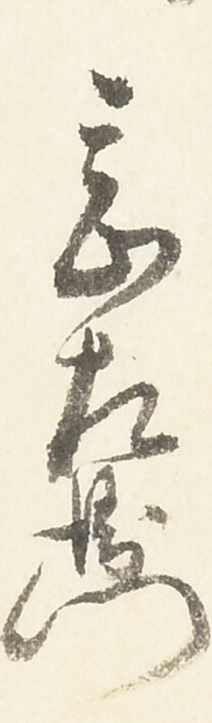治左衛門

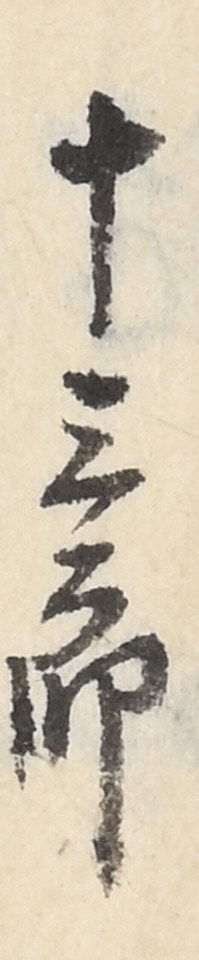十三郎
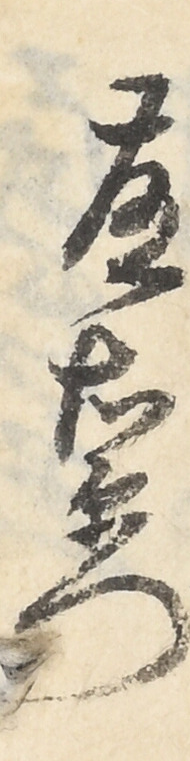藤右衛門
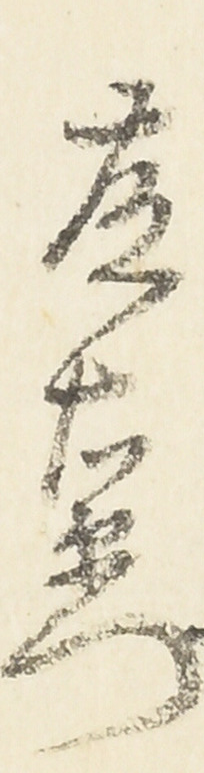藤右衛門
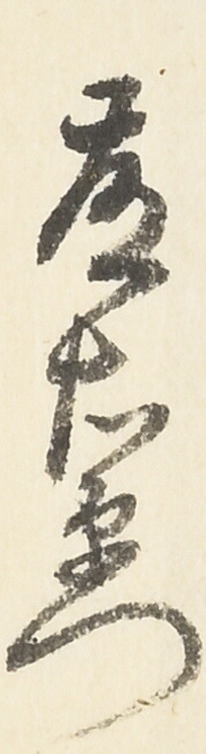藤右衛門
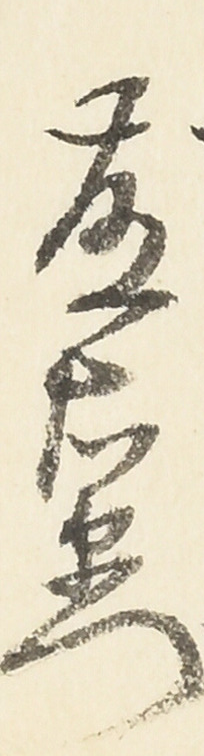藤右衛門
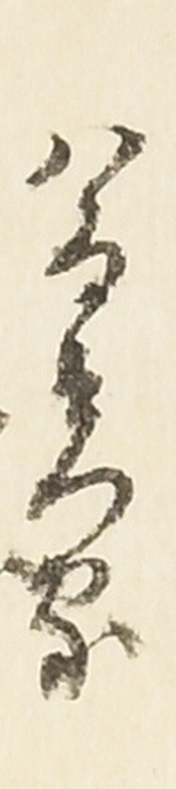八百右衛門
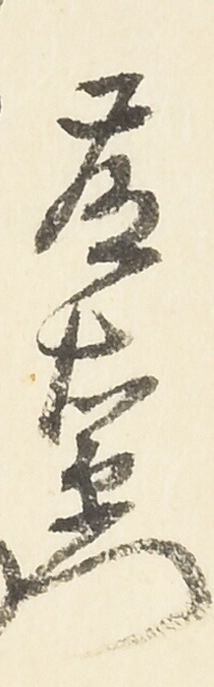藤右衛門
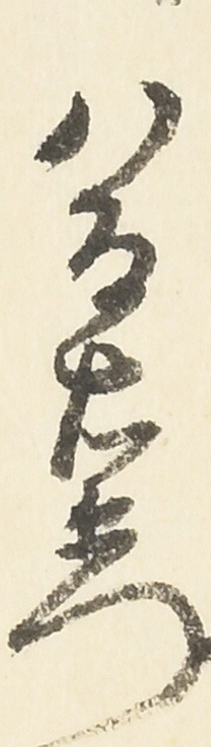八百右衛門
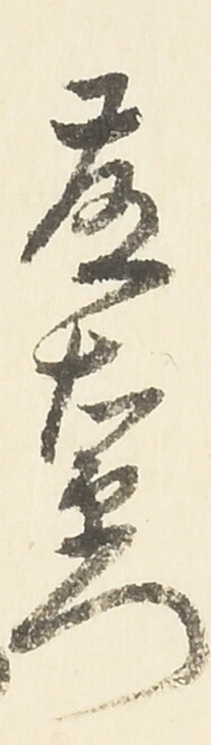藤右衛門
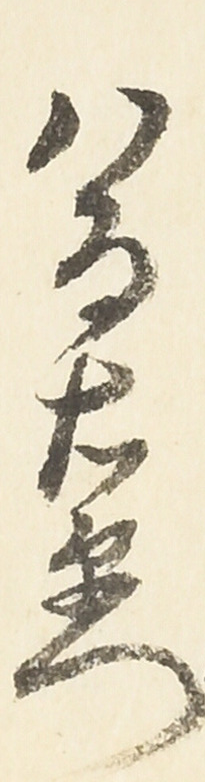八百右衛門
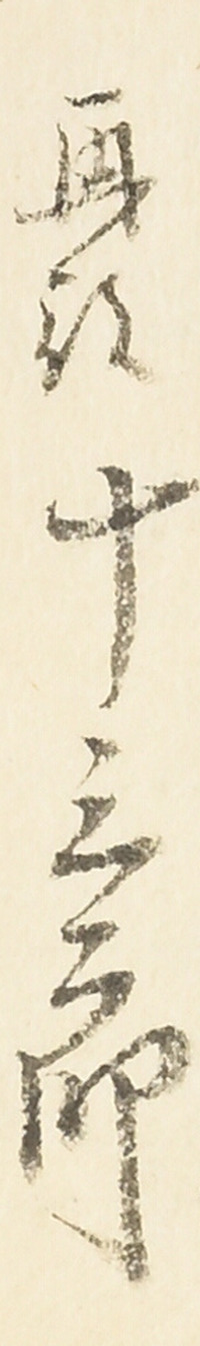再役十三郎
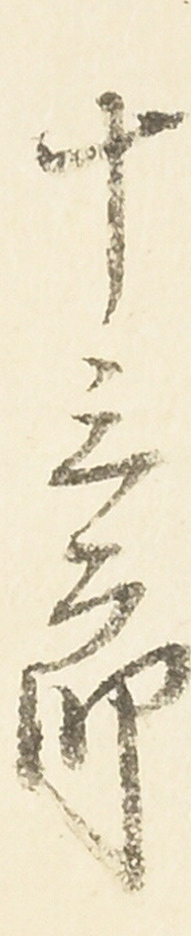十三郎
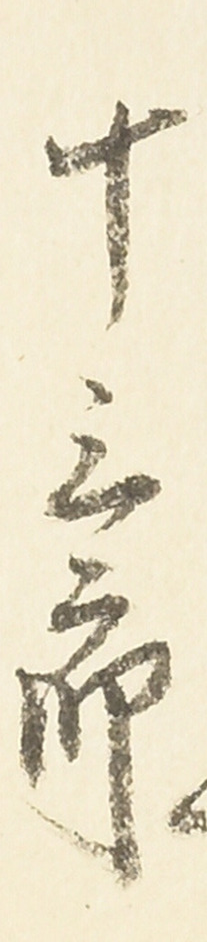十三郎
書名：鉾持町丁代勤役年歴順控
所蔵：伊那市立高遠町図書館・合同会社AMANE
